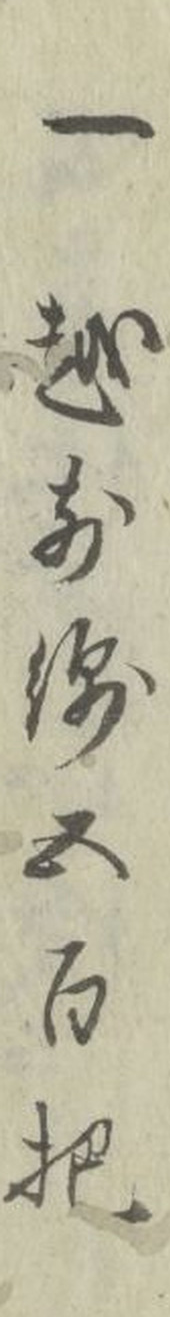一越前錦五百把

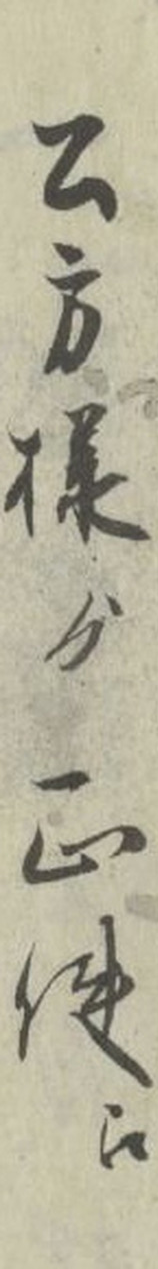公方様ゟ正使え
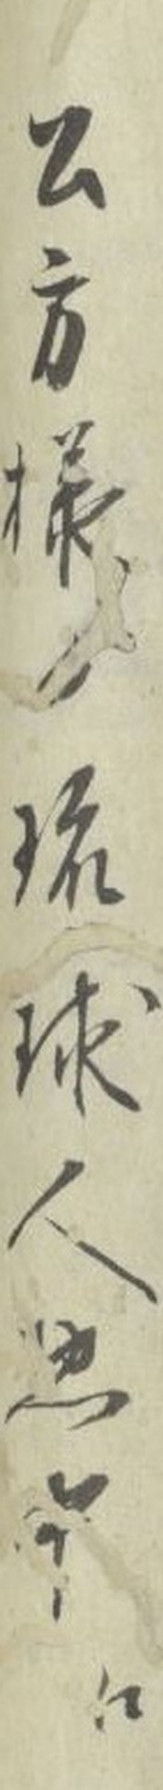公方様ゟ琉球人惣中え
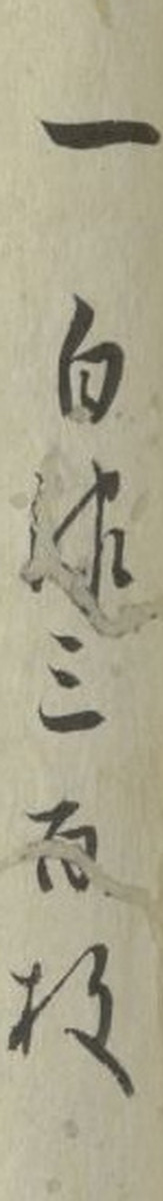一白銀三百枚
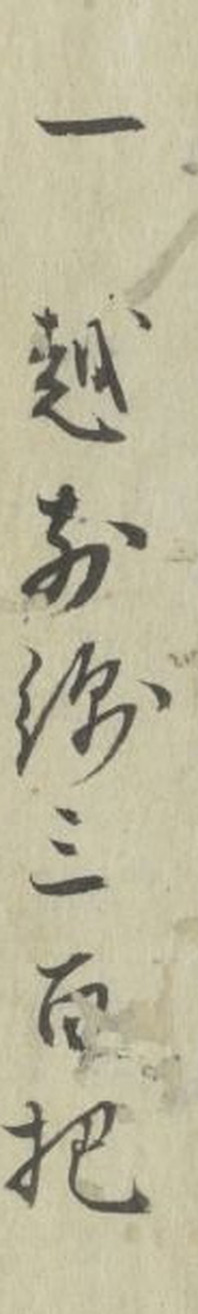一越前錦三百把
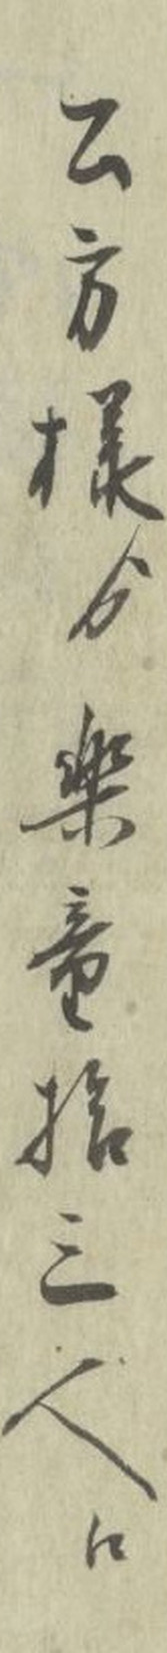公方様ゟ楽童拾三人え

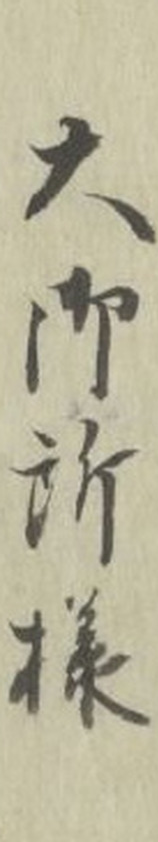大御所様
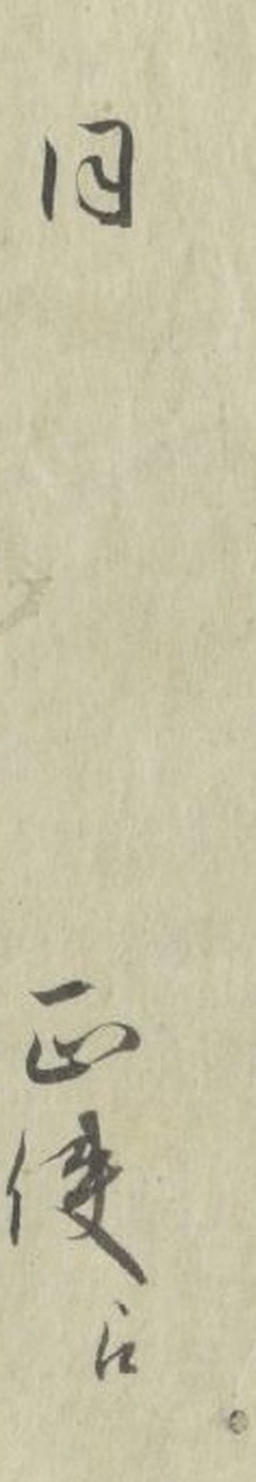同正使え
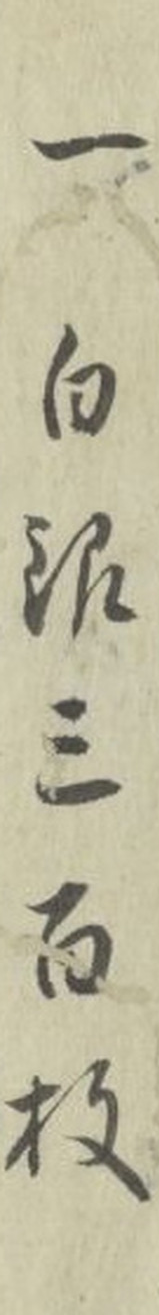一白銀三百枚
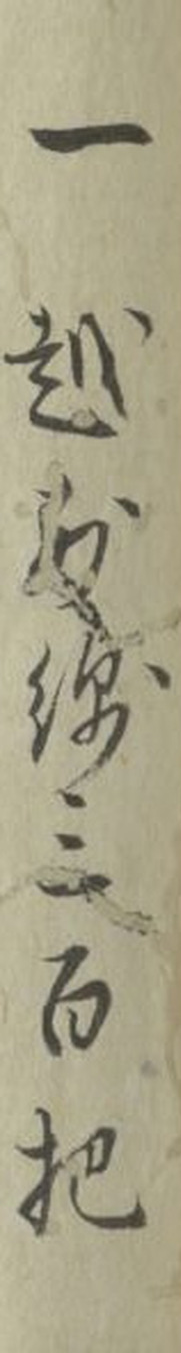一越前綿棧百把
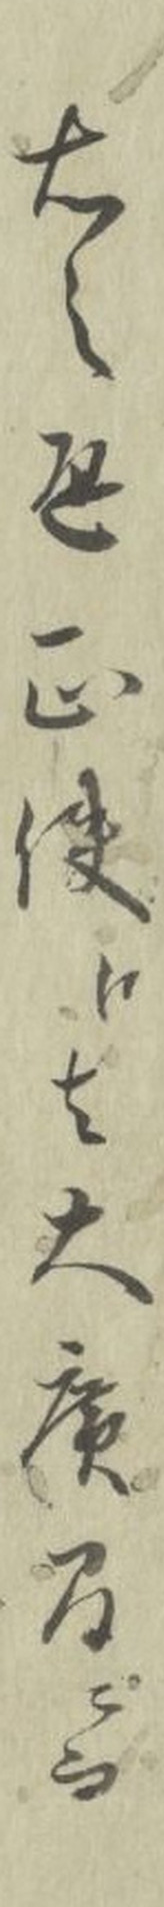右之通正使えは大広間に而
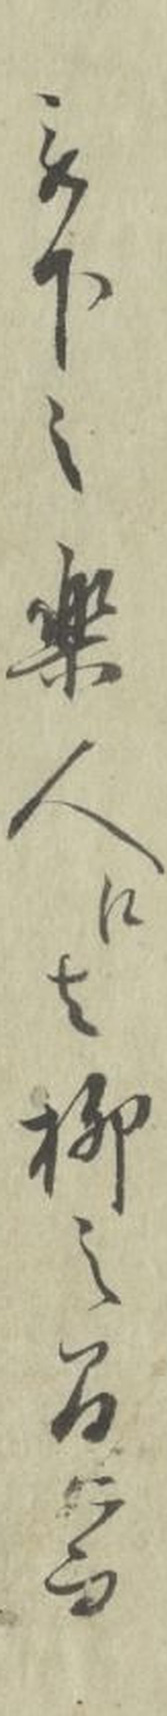被下之楽人えは柳之間に而
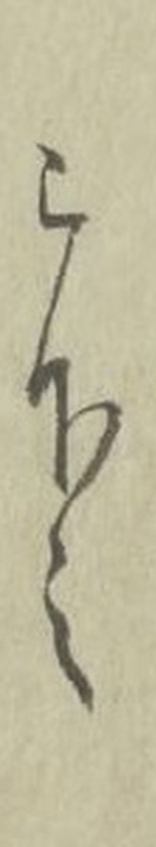被下之

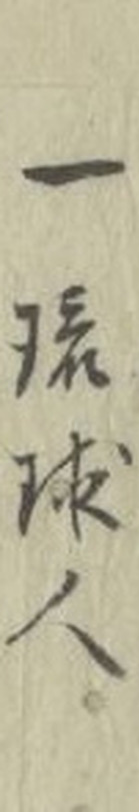一琉球人
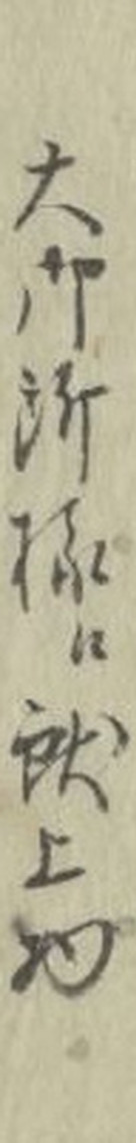大御所様え献上物
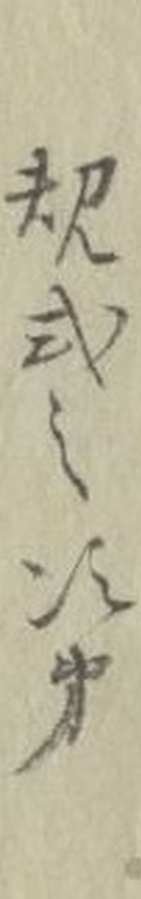規式之次第
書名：琉球来朝記 自八至十四終
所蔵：University of the Ryukyus Library
